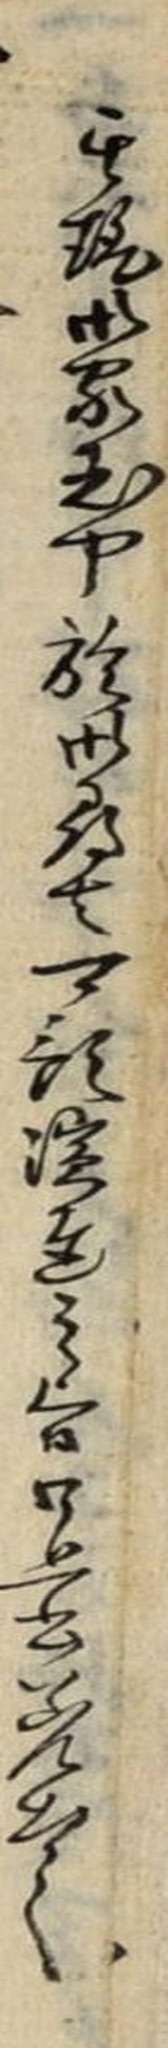其趣御家老中於御尋は可願演達之旨口上書差出之
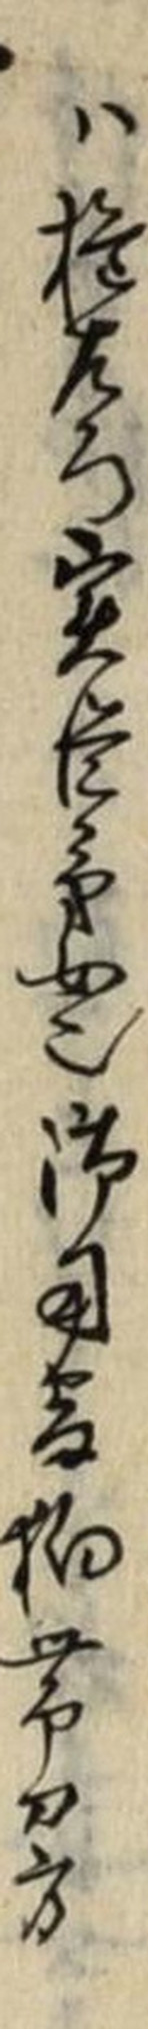は権左衛門実従弟女也御用番柏帯刀方
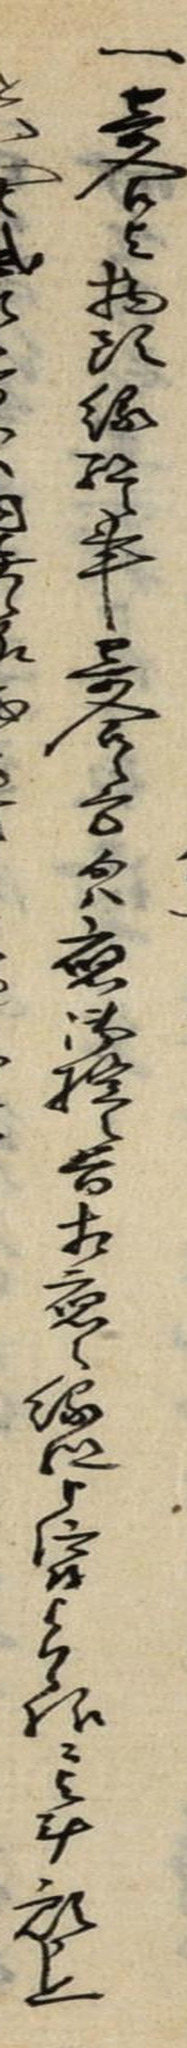一寄合と物頭縁組之事寄合之方ゟは応御掟之旨相応之縁組被仰付被下候様にと計願申上
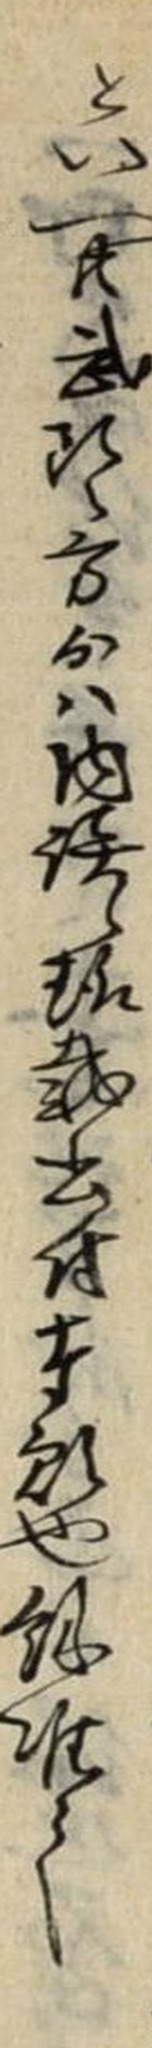といへ共武頭之方ゟは内談之趣載書付奉願也余准之
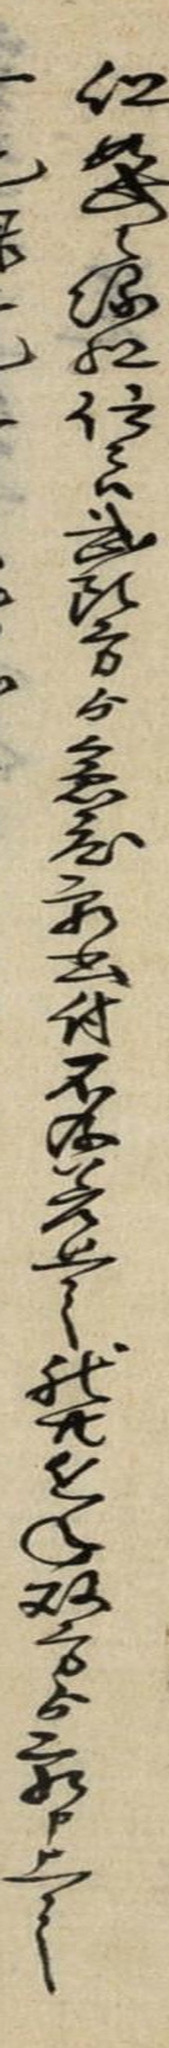但如此之縁組仰ニハ武頭方ゟ急度願書付不及差上之然共近年双方ゟ願申上之
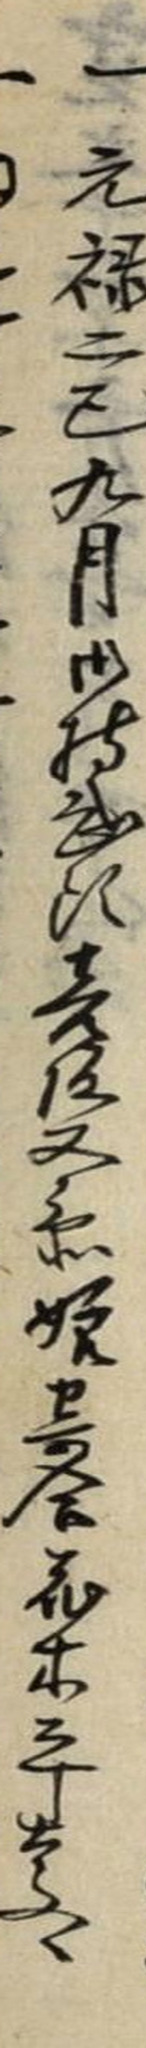一元禄二巳九月御持武頭彦坂又兵衛娘寄合花木平太夫へ
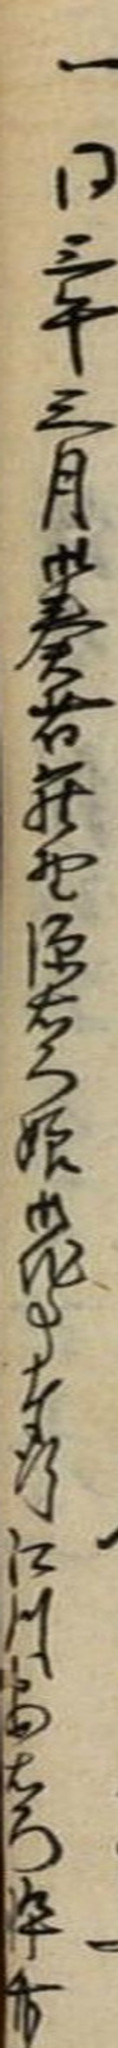一同三午三月御奏者荻野源右衛門娘御作事奉行江川番右衛門悴市之助ヘ
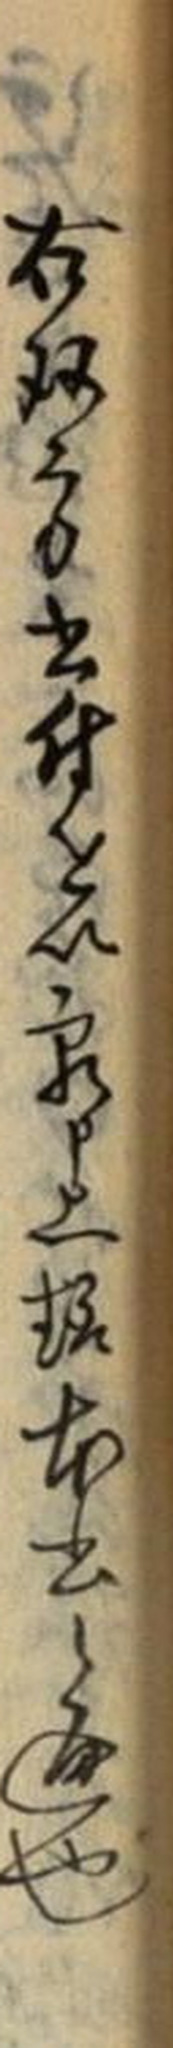右双方書付を以願申上趣本書之通也
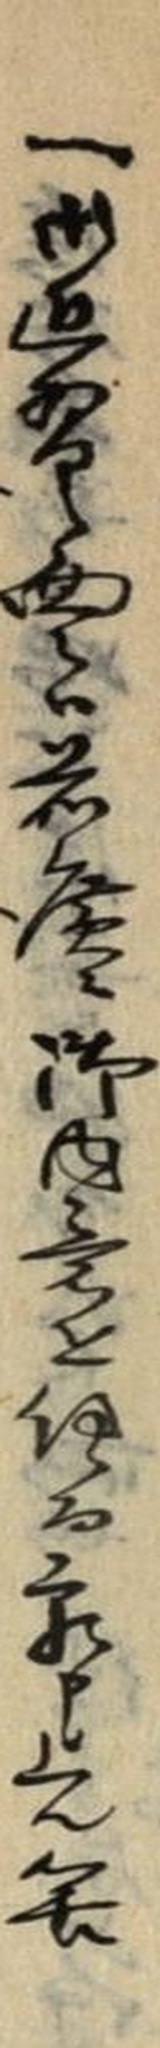一御近習之面々は前広に御内意を伺候而願申上る筈
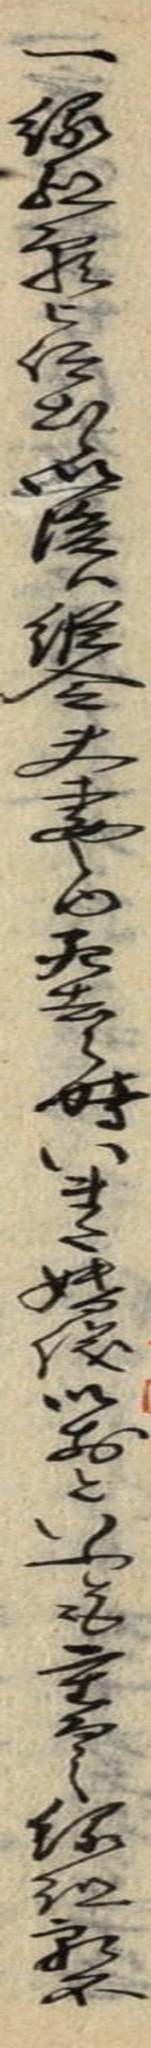一縁組願被仰出候御後は仮令夫妻之内死去之時いまた婚儀御前といふも重而之縁組願不
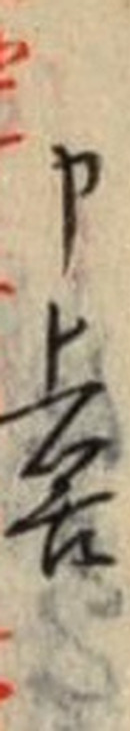申上筈
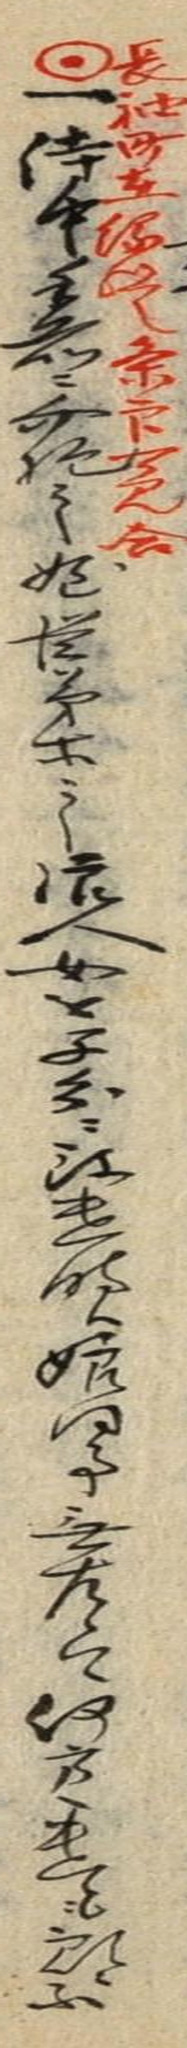一侍中手前に介抱之姪従弟等之浪人女を子分に致遣時は娘同時無左候はゝ何方へ遣も願に不
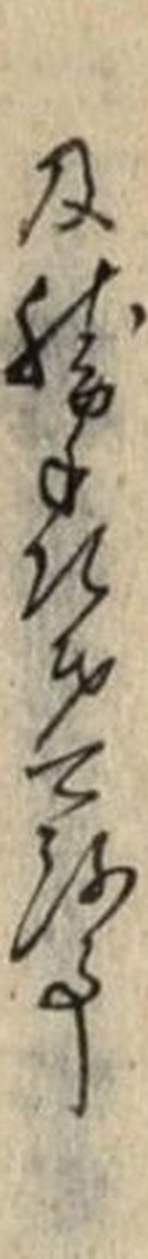及勝手次第可致事
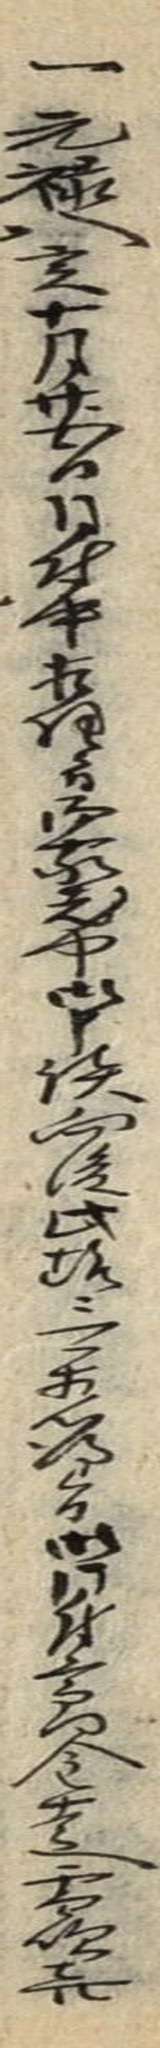一元禄八亥十月廿五日目付中相伺候に付御家老中御申談向後此趣に可相心得旨御目付高田金太夫雪吹喜
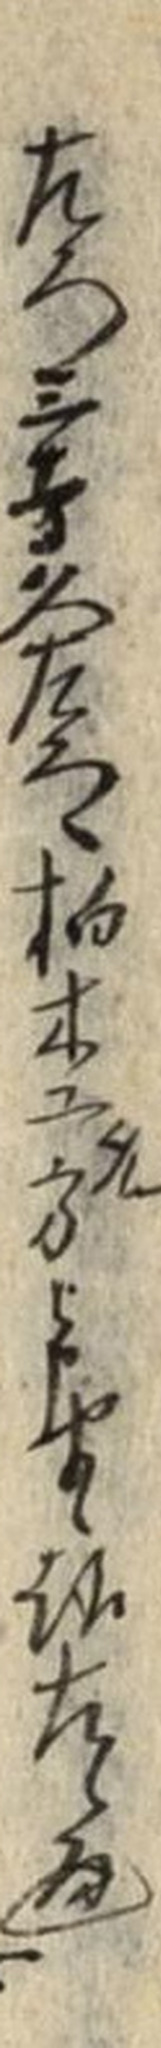左衛門三寺久左衛門へ柏杢允方被申聞候趣左之通
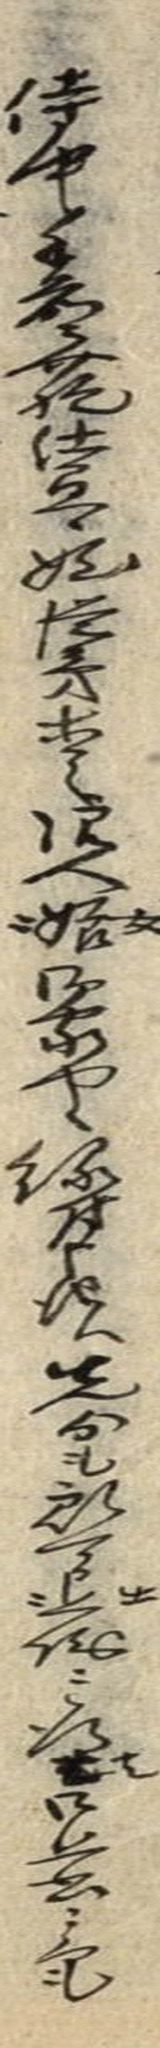侍中手前に介抱仕置候姪従弟等之浪人娘御家中へ縁付申儀は先ゟも願可申上儀に候得は口上書に而も
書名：養子縁組之部
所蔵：福井県文書館 Fukui Prefectural Archives
